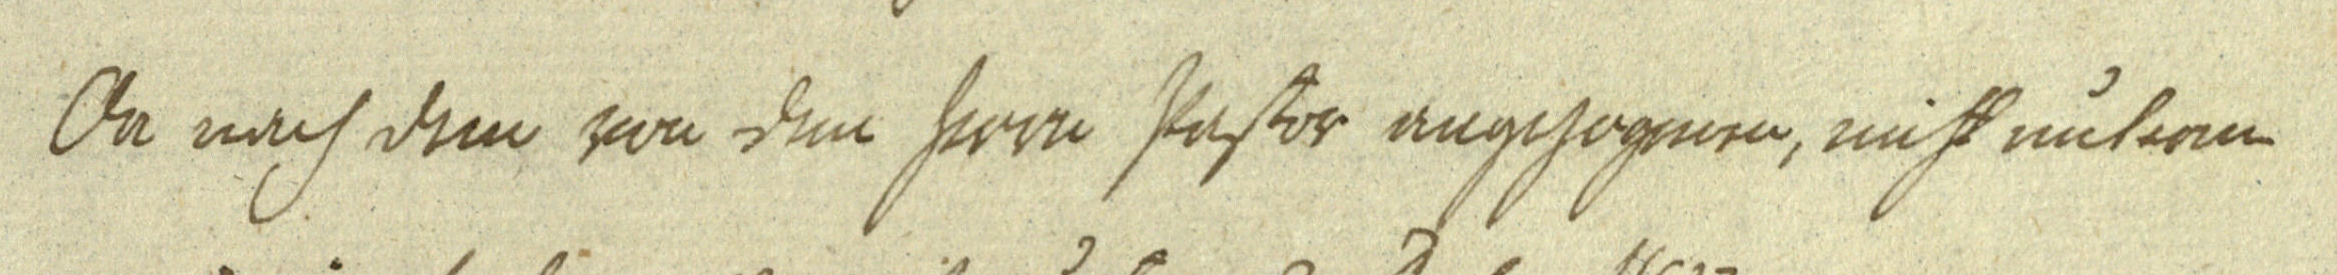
Da nach dem von dem Herrn Pastor angezogenen, nicht unterm
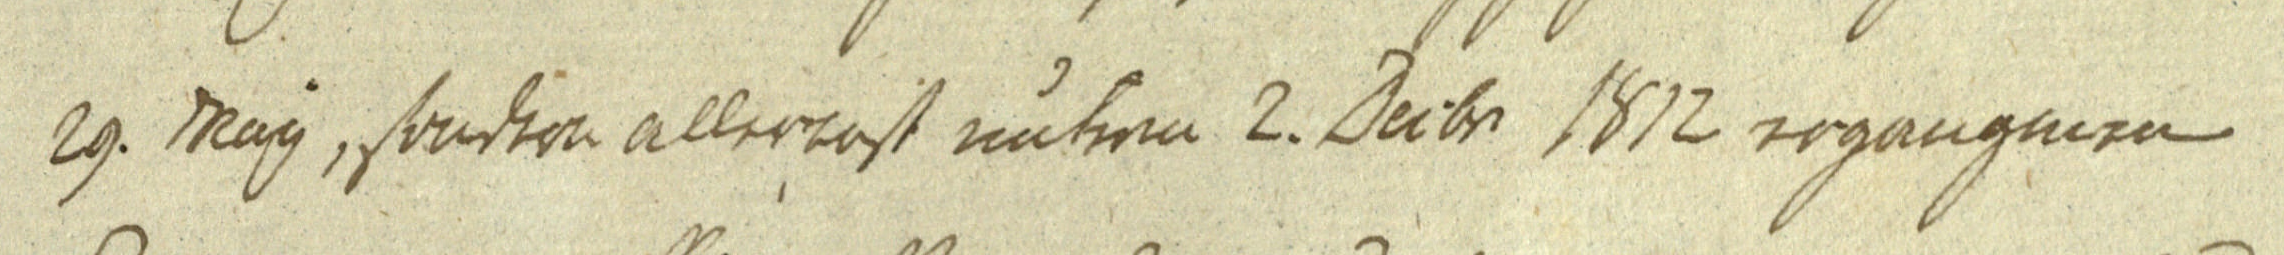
29. Maÿ, sondern allererst unterm 2. Decbr 1812 ergangenen
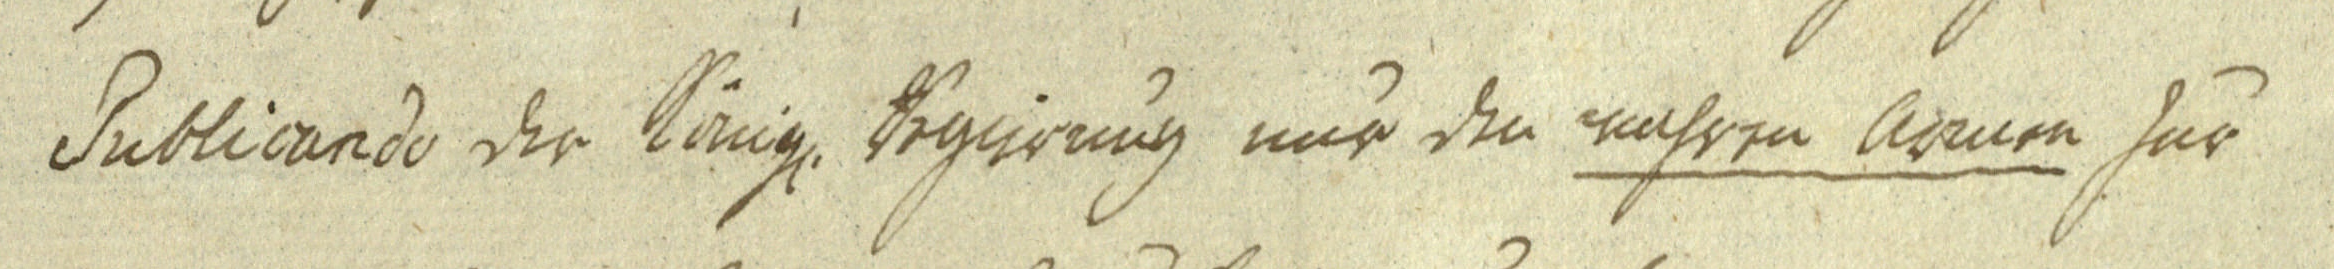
Publicando der Königl. Regierung nur den wahren Armen zur
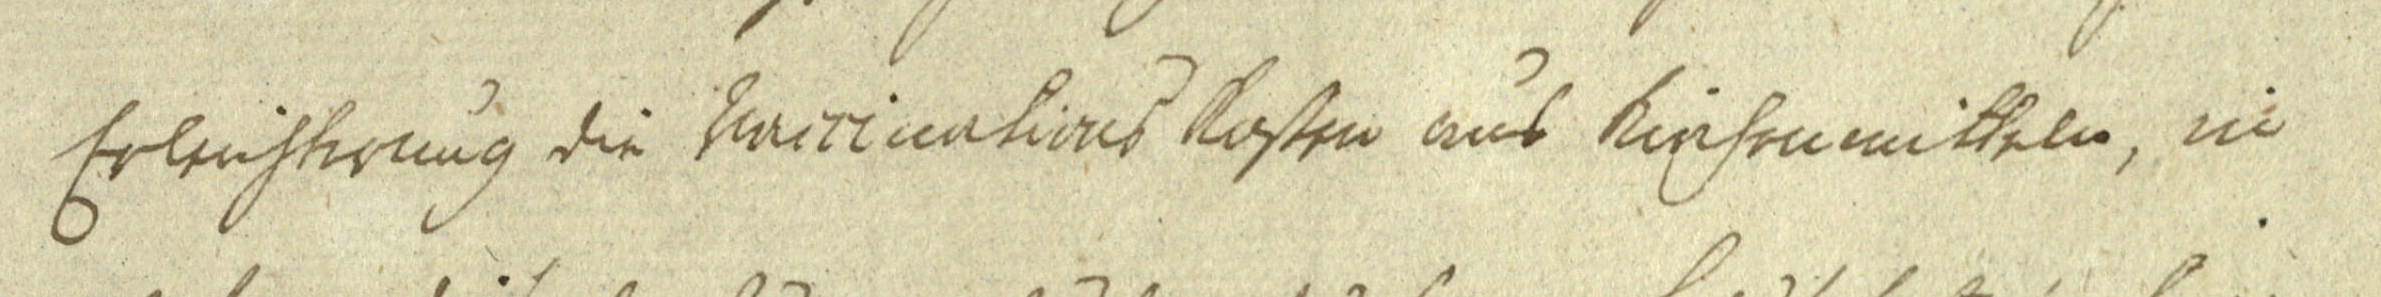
Erleichterung die Vaccinations Kosten aus Kirchenmitteln, in
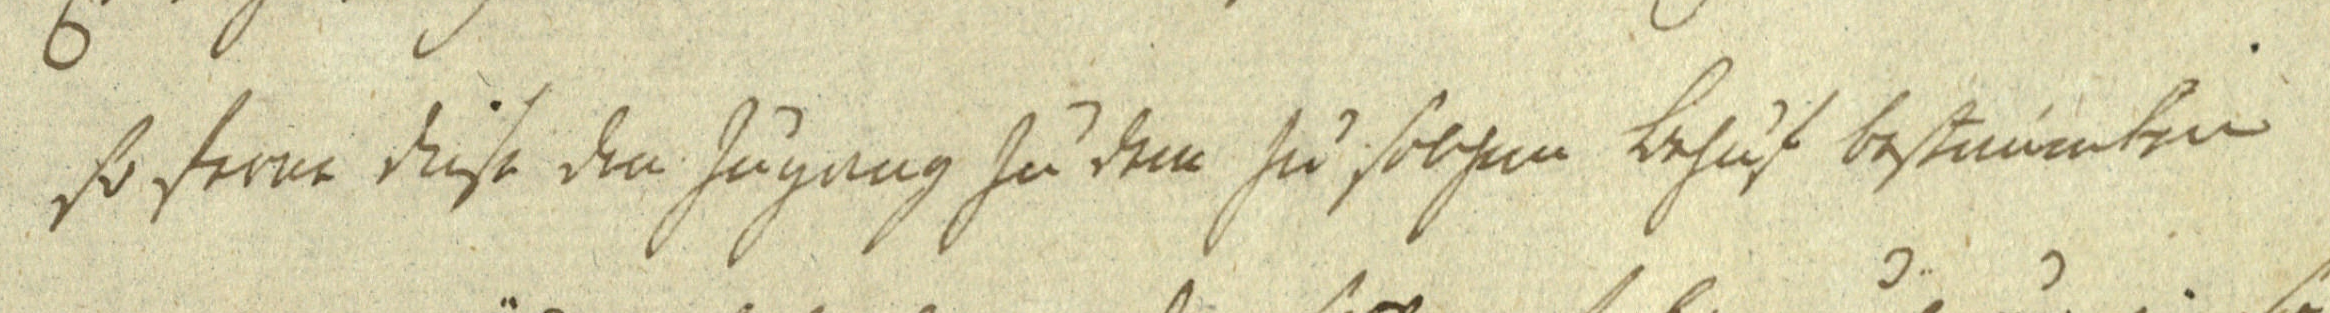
so ferne diese den Zugang zu dem zu solchen Behuf bestimmten
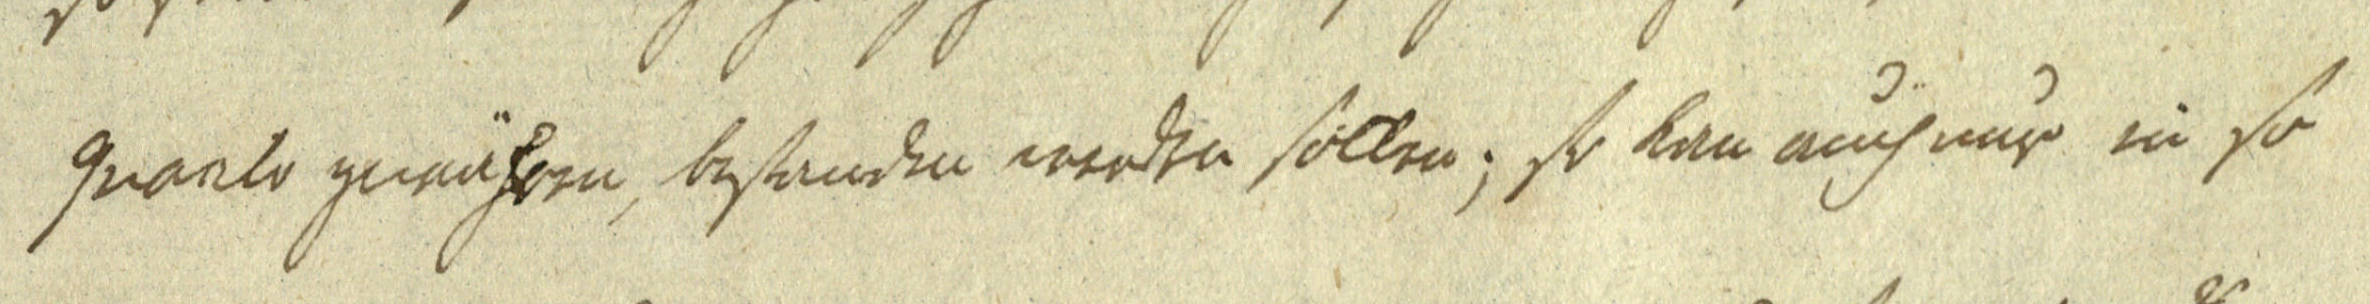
Quanto gewähren, bestanden werden sollen; so kan auch nur in so
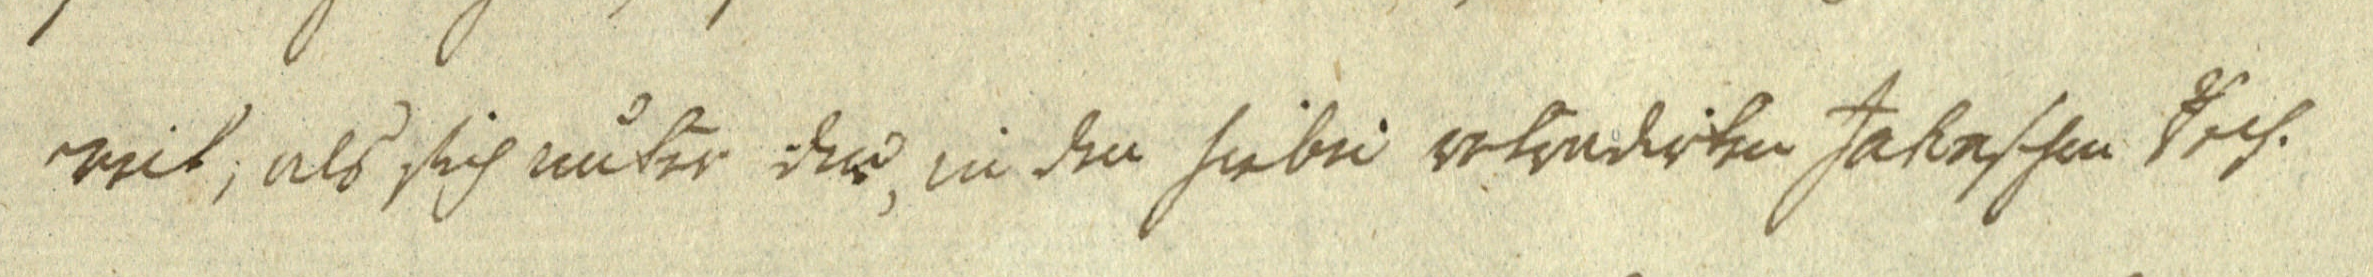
weit; als sich unter der, in den hiebei retradirten Jahnschen Rech¬
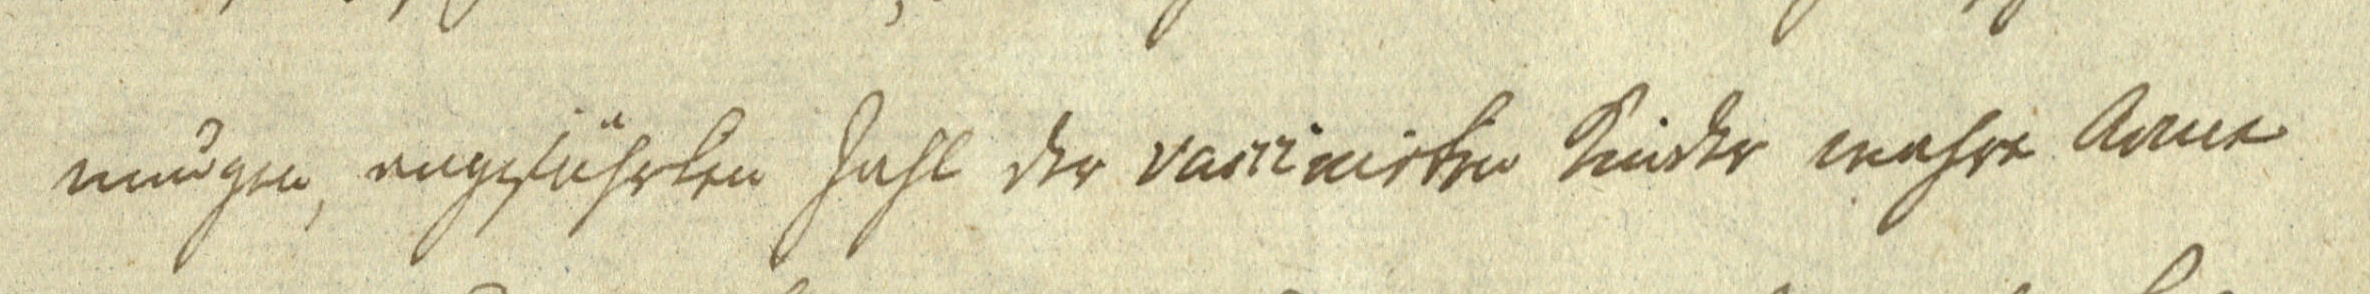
nungen, angeführten Zahl der vaccinirten Kinder wahre Arme
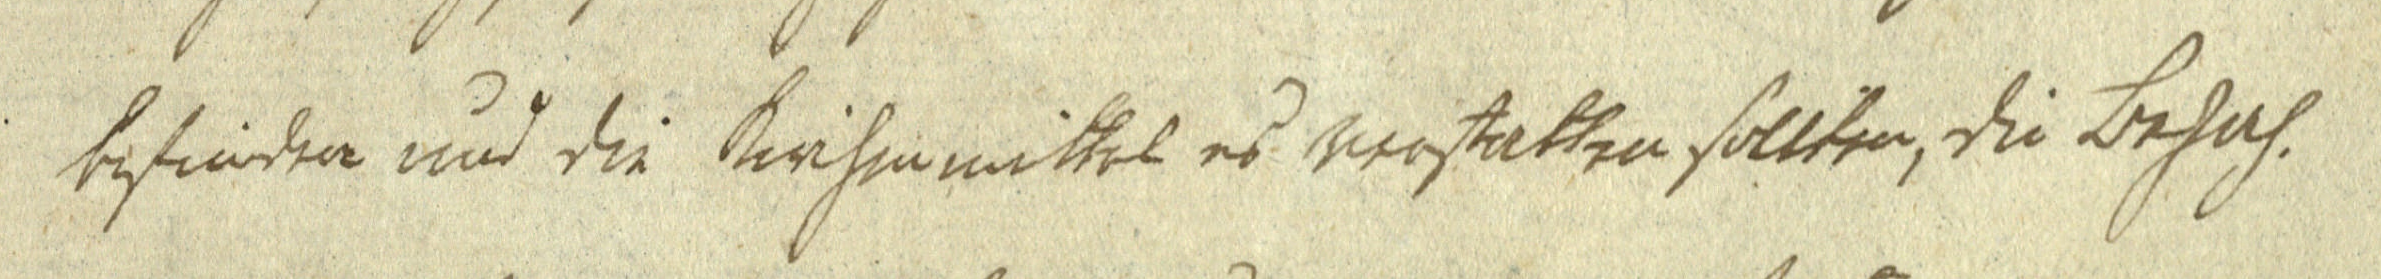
befinden und die Kirchenmittel es verstatten sollten, die Bezah¬
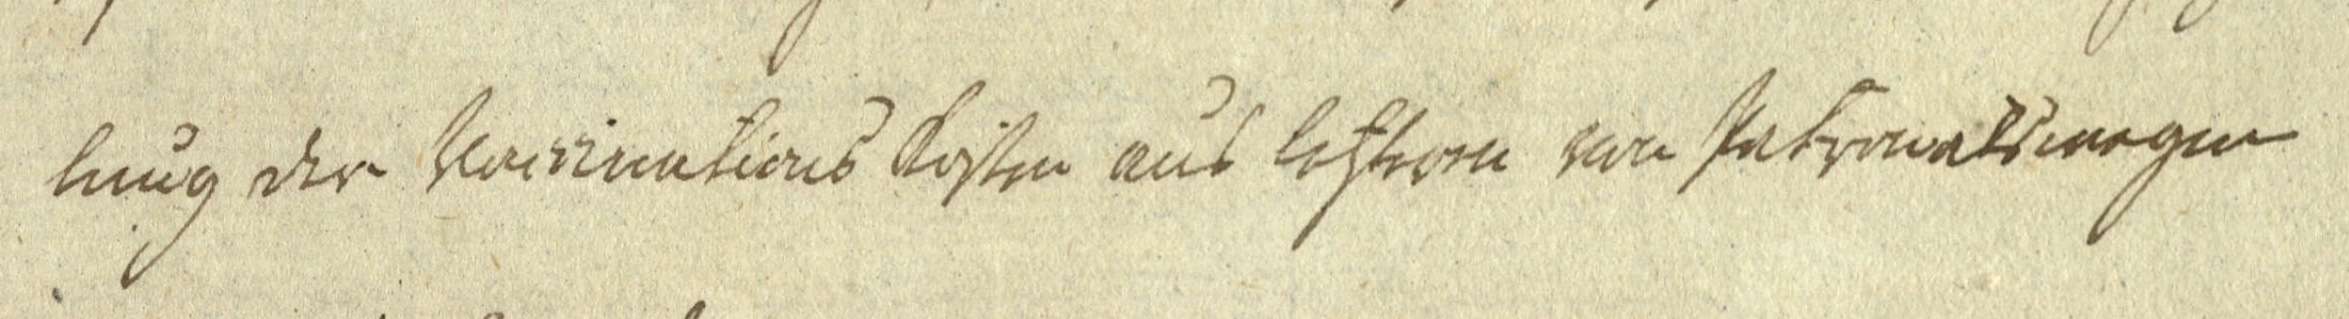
lung der Vaccinations Kosten aus letzteren von Patronatswegen
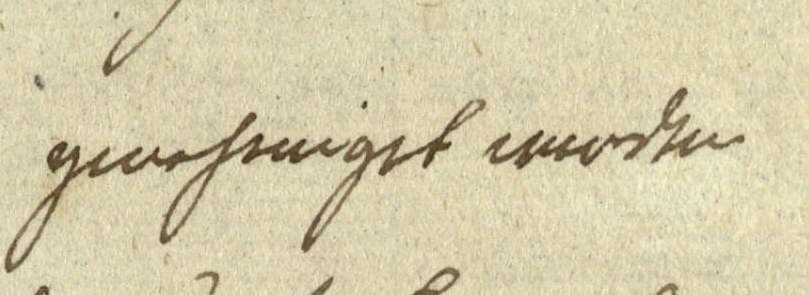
genehmiget werden.
